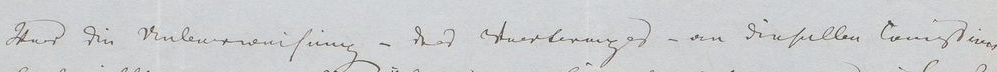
Was die Ueberweisung, des Vertrags, an dieselbe Comission
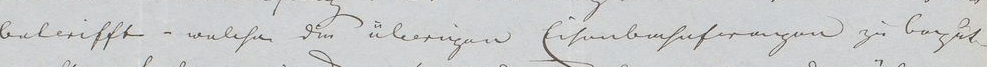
betrifft, welche die übrigen Eisenbahnfragen zu begut-
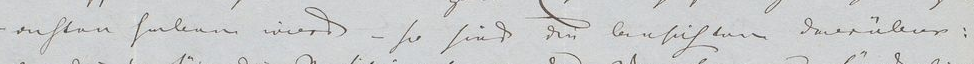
achten haben wird, so sind die Ansichten darüber:
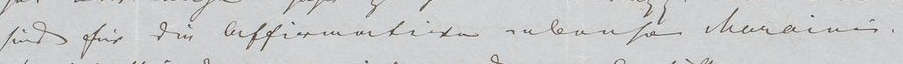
sind für die Affirmative ebenso Maraini.
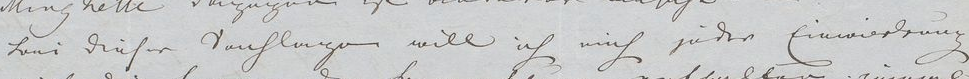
Bei dieser Sachlage will ich mich deder Einwirkung
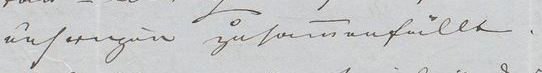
unsrigen zusammenfällt. –
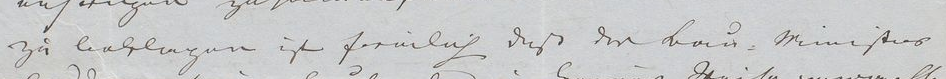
Zu beklagen ist freilich daß der Bau-Minister
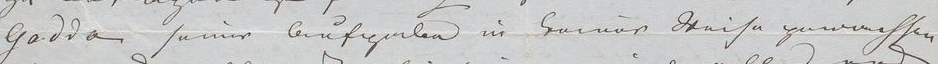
Gadda seiner Aufgabe in keiner Weise gewachsen
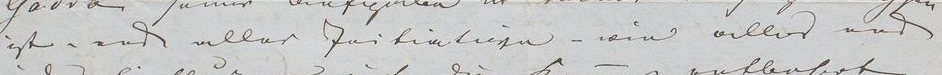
ist, und aller Initiative, wie alles und
